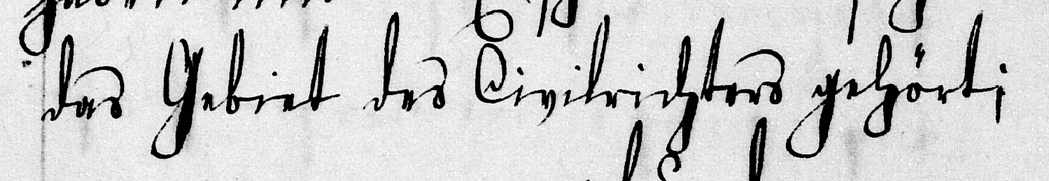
das Gebiet des Civilrichters gehört;
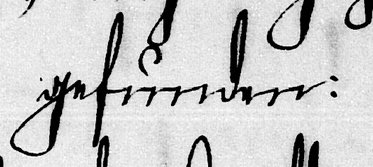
gefunden:
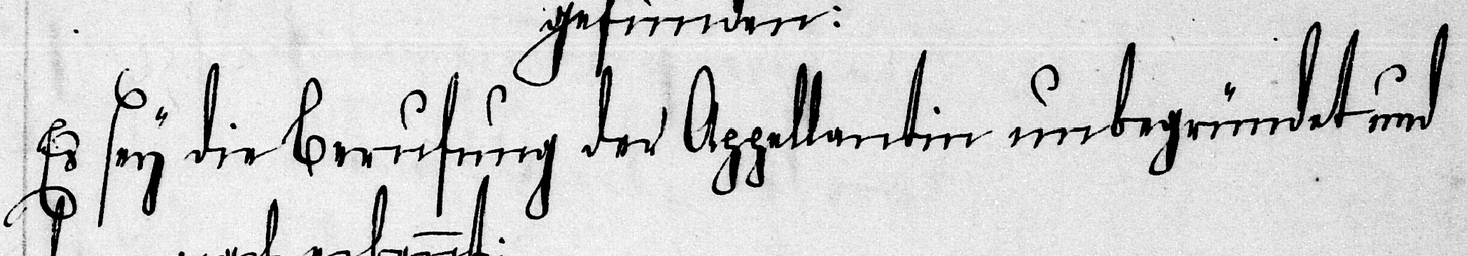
Es sey die Berufung der Appellantin unbegründet und
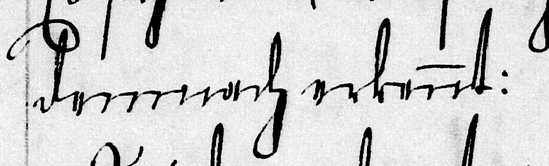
demnach erkennt:
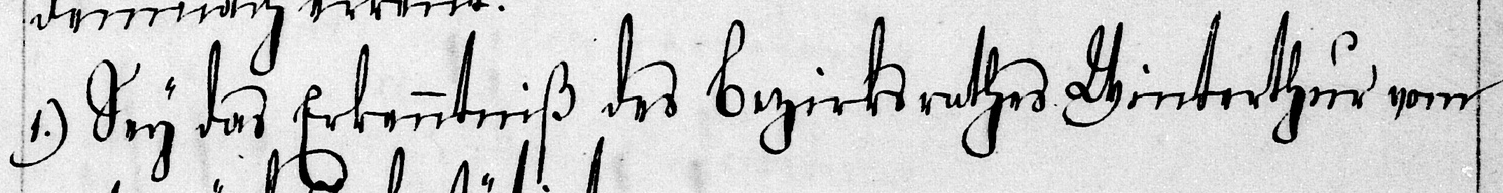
1.) Sey das Erkenntniß des Bezirksrathes Winterthur vom
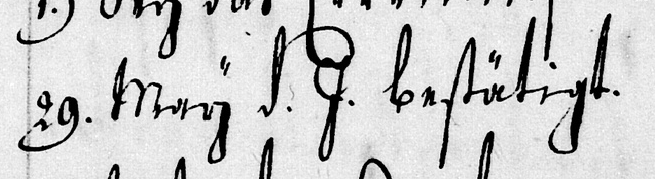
29. May d. J. bestätigt.
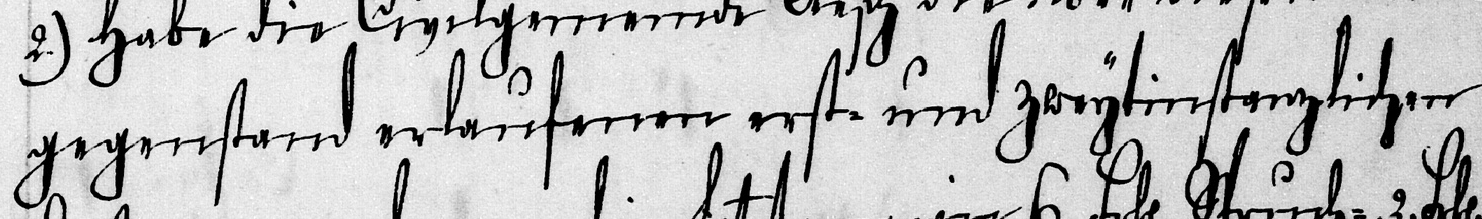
gegenstand erlaufenen erst- und zweytinstanzlichen
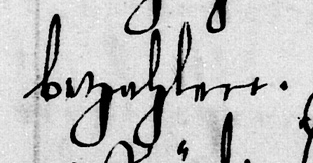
bezahlen.
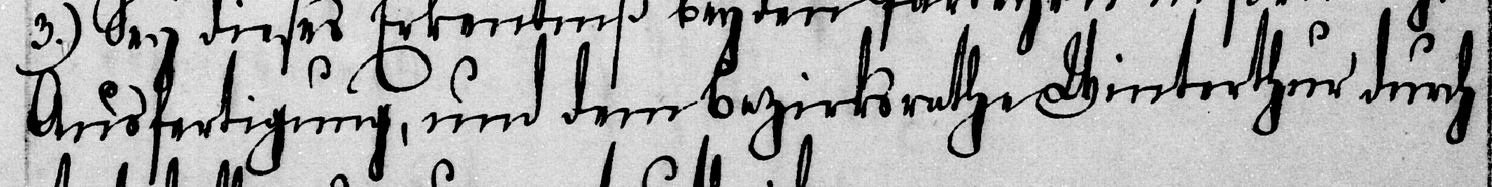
Ausfertigung, und dem Bezirksrathe Winterthur durch
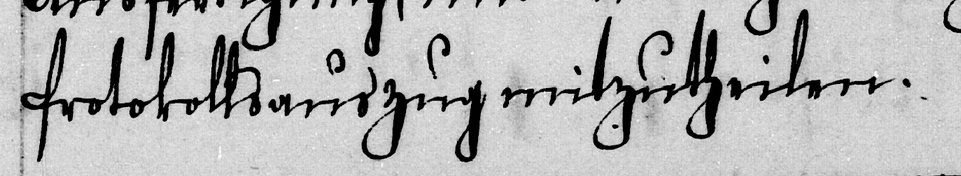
Protokollsauszug mitzutheilen.
